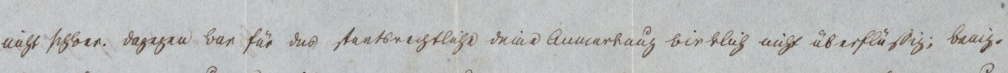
nicht schwer. Dagegen war für das staatsrechtliche Deine Anmerkung wirklich nicht überflüssig; wenig-
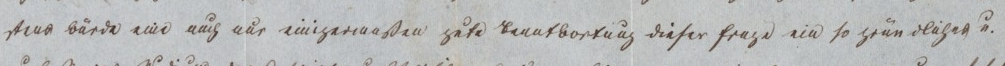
stens würde eine auch nur einigermaßen gute Beantwortung dieser Frage ein so gründliches u.
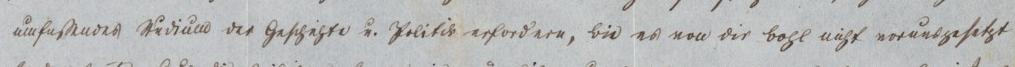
umfassendes Studium der Geschichte u. Politik erfordern, wie es von Dir wohl nicht vorausgesetzt
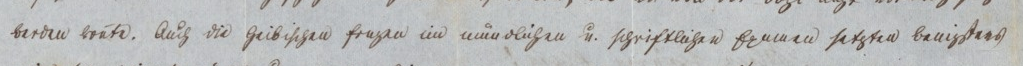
werden konnte. Auch die Geibischen Fragen im mündlichen u. schriftlichen Examen setzten wenigstens
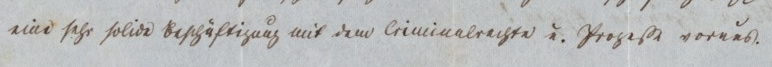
eine sehr solide Beschäftigung mit dem Criminalrechte u. Prozesse voraus.
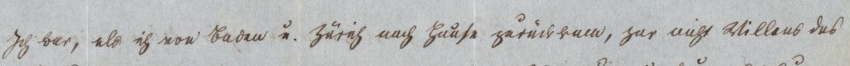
Ich war, als ich von Baden u. Zürich nach Hause zurückkam, gar nicht Willens das
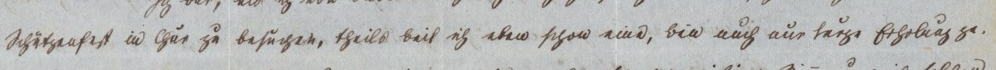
Schützenfest in Chur zu besuchen, theils weil ich eben schon eine, wenn auch nur kurze Erholung ge-
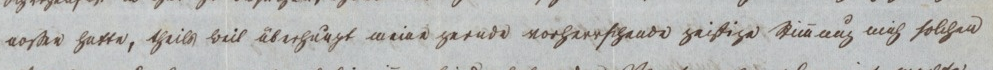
nossen hatte, theils weil überhaupt meine gerade vorherrschende geistige Stimmung mich solchen
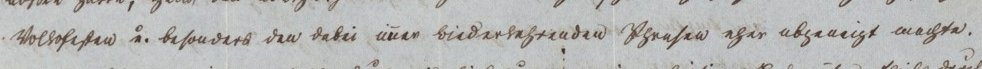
Volksfesten u. besonders den dabei immer wiederkehrenden Phrasen eher abgeneigt machte.
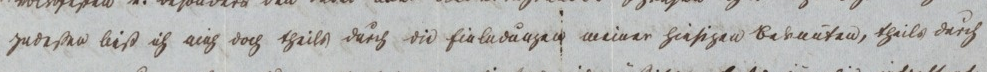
Indessen ließ ich mich doch theils durch die Einladungen meiner hiesigen Bekannten, theils durch
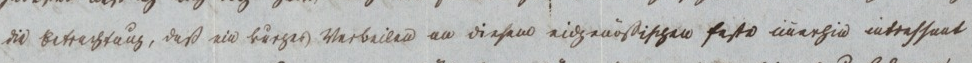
die Betrachtung, daß ein kurzes Verweilen an diesem eidgenössischen Feste immerhin intressant
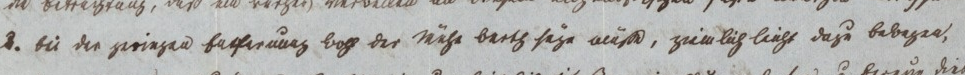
u. bei der geringen Entfernung wohl der Mühe werth seyn müsse, ziemlich leicht dazu bewegen,
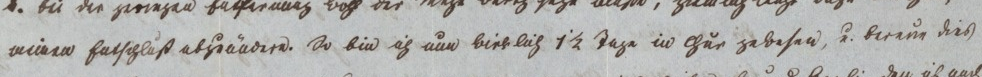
meinen Entschluß abzuändern. So bin ich nun wirklich 1½ Tage in Chur gewesen, u. bereue dies
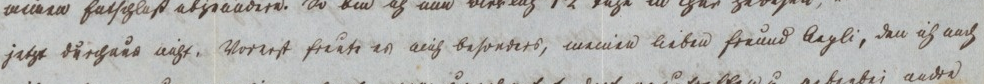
jetzt durchaus nicht. Vorerst freute es mich besonders, meinen lieben Freund Aepli, den ich nach
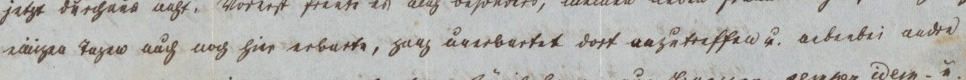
einigen Tagen auch noch hier erwarte, ganz unerwartet dort anzutreffen u. nebenbei andre
